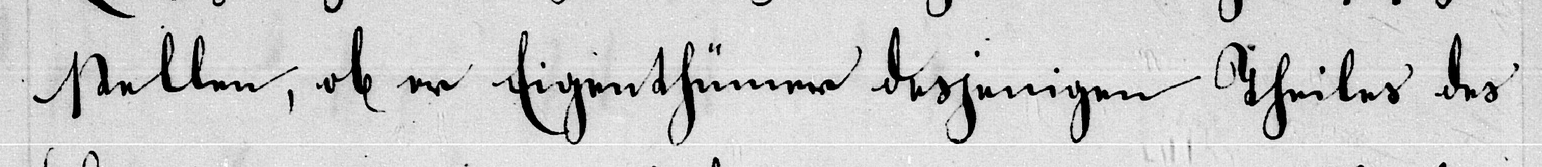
stellen, ob er Eigenthümer desjenigen Theiles des
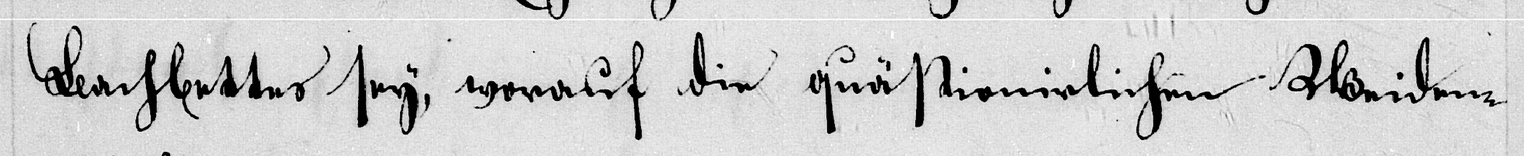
Bachbettes sey, worauf die quästionirlichen Weiden¬
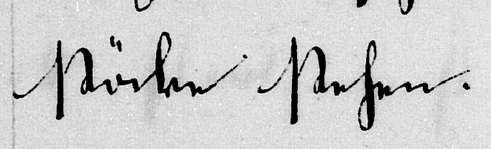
stöcke stehen.
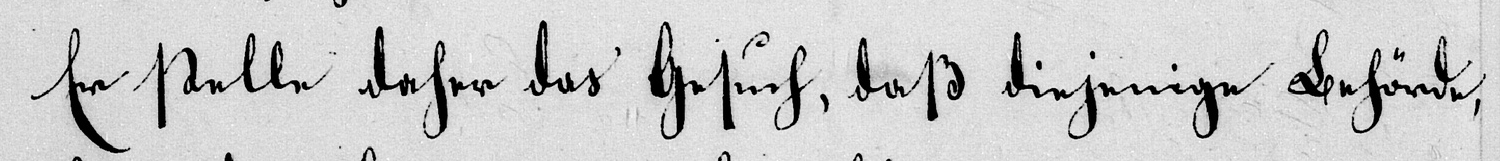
Er stelle daher das Gesuch, daß diejenige Behörde,
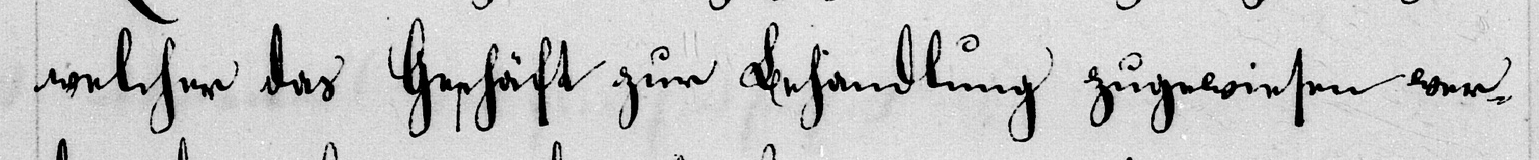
welcher das Geschäft zur Behandlung zugewiesen wer¬
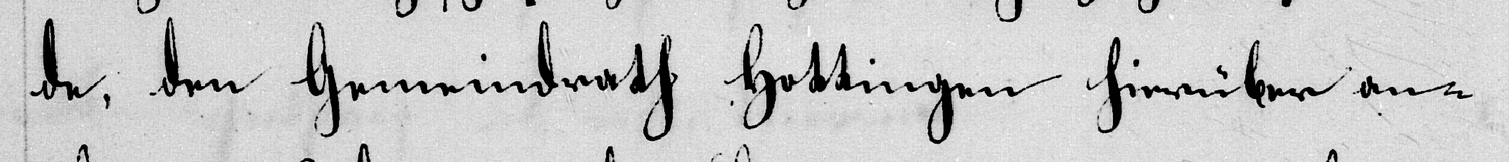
de, den Gemeindrath Hottingen hierüber an¬
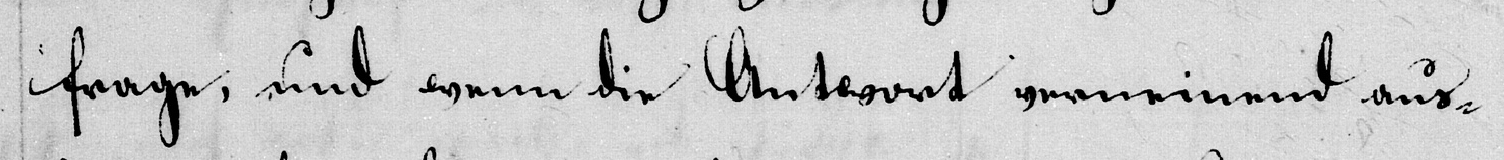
frage, und wenn die Antwort verneinend aus¬
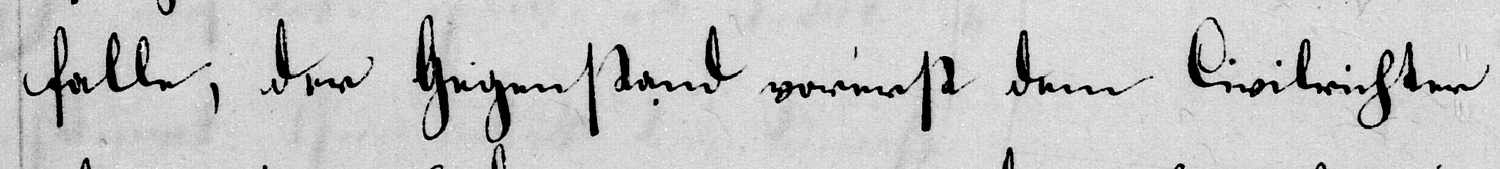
falle, der Gegenstand vorerst dem Civilrichter
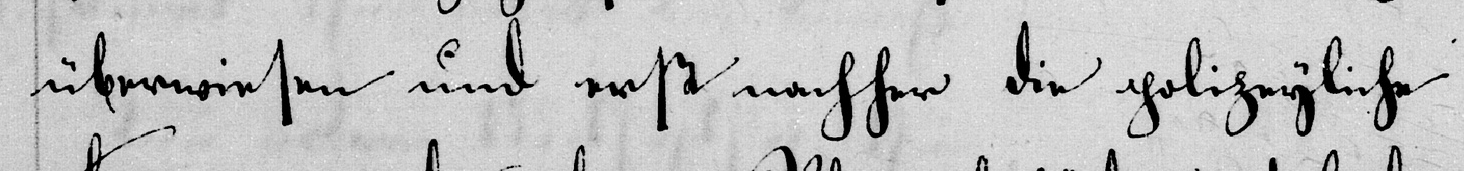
überwiesen und erst nachher die polizeyliche
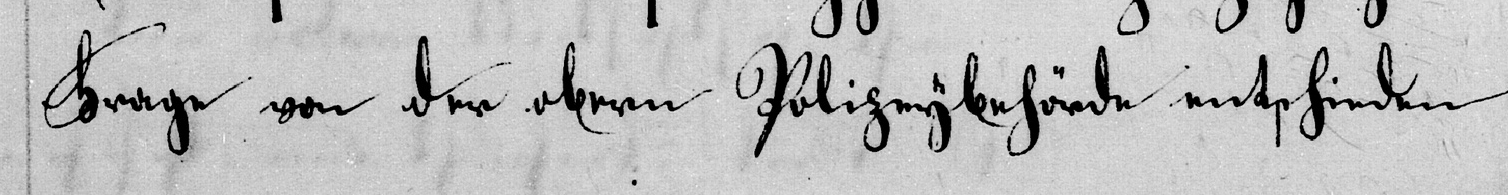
Frage von der obern Polizeybehörde entschieden
